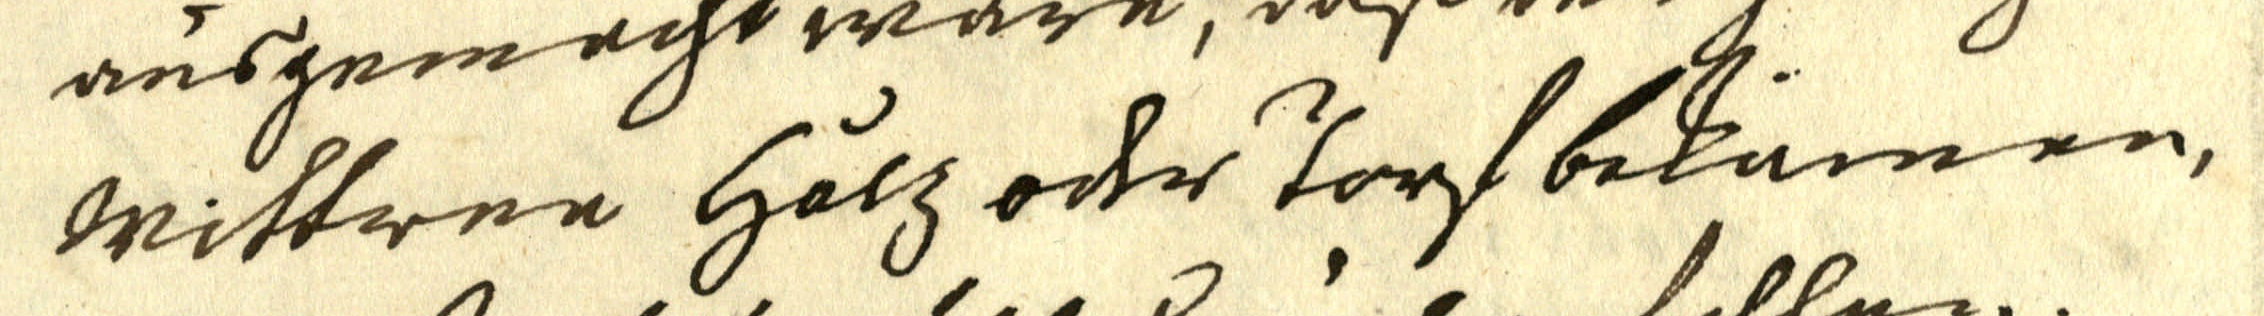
Wittwen Holz oder Torf bekämen,
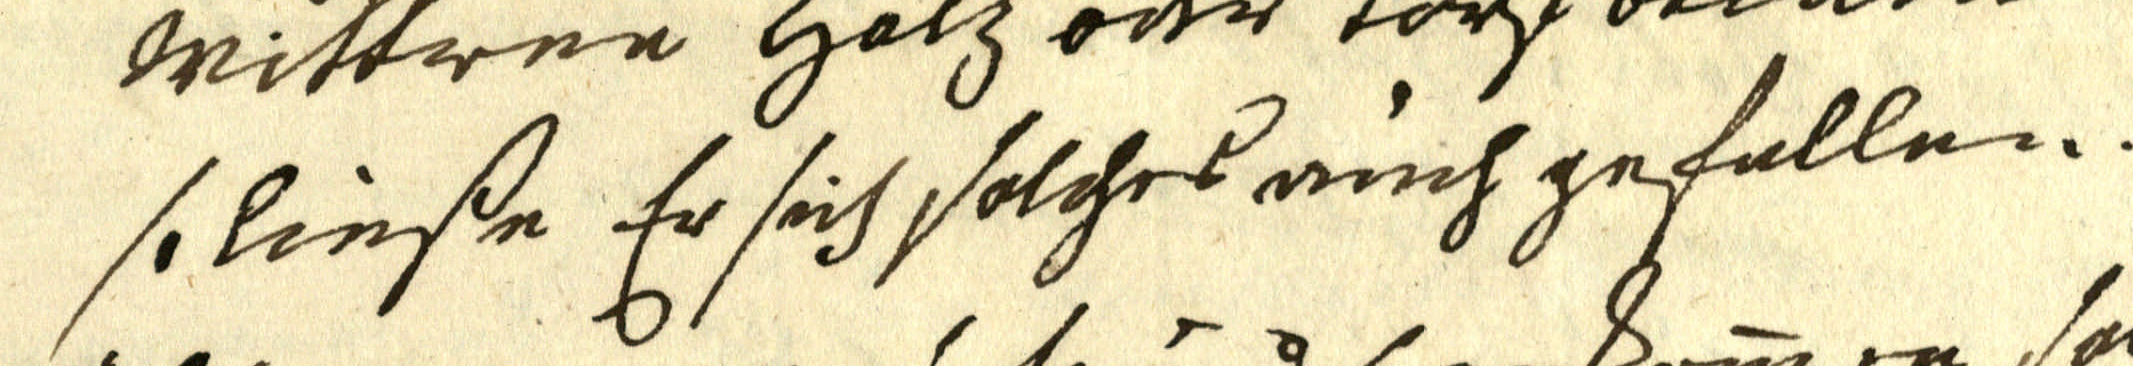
so ließe Er sich solches auch gefallen.
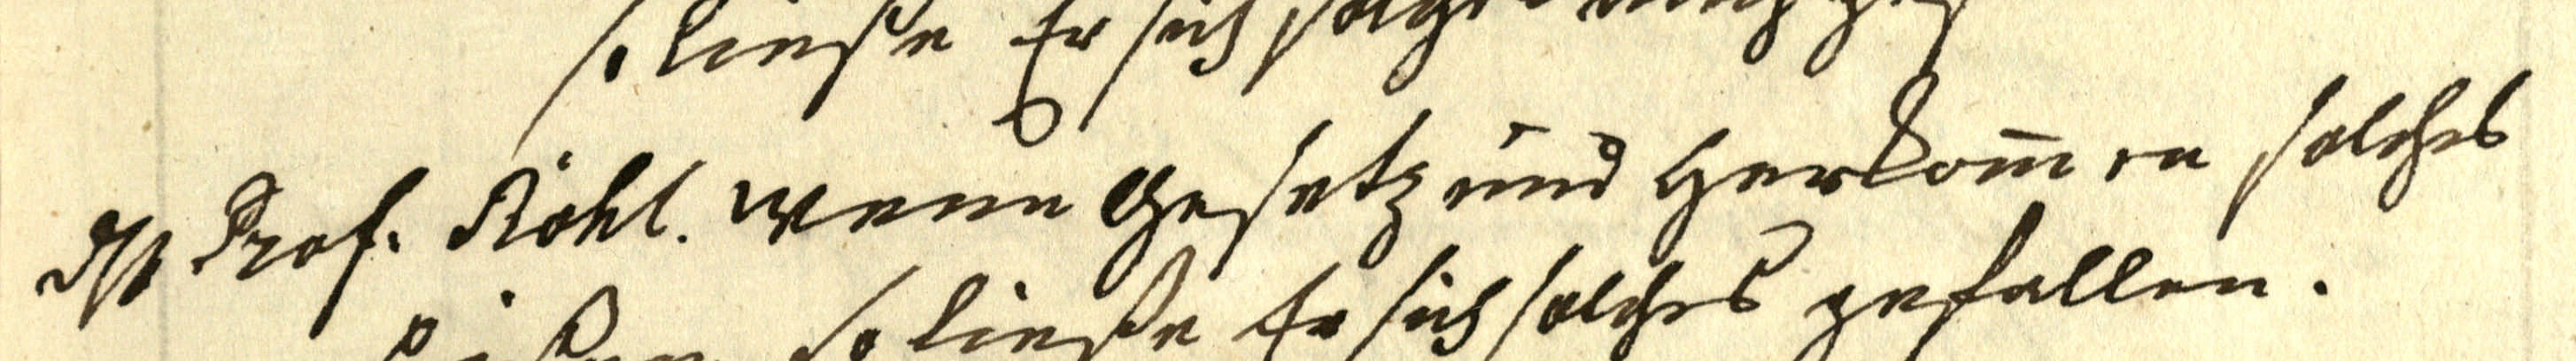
dh Prof. Röhl. wenn Gesetz und Herkomen solches
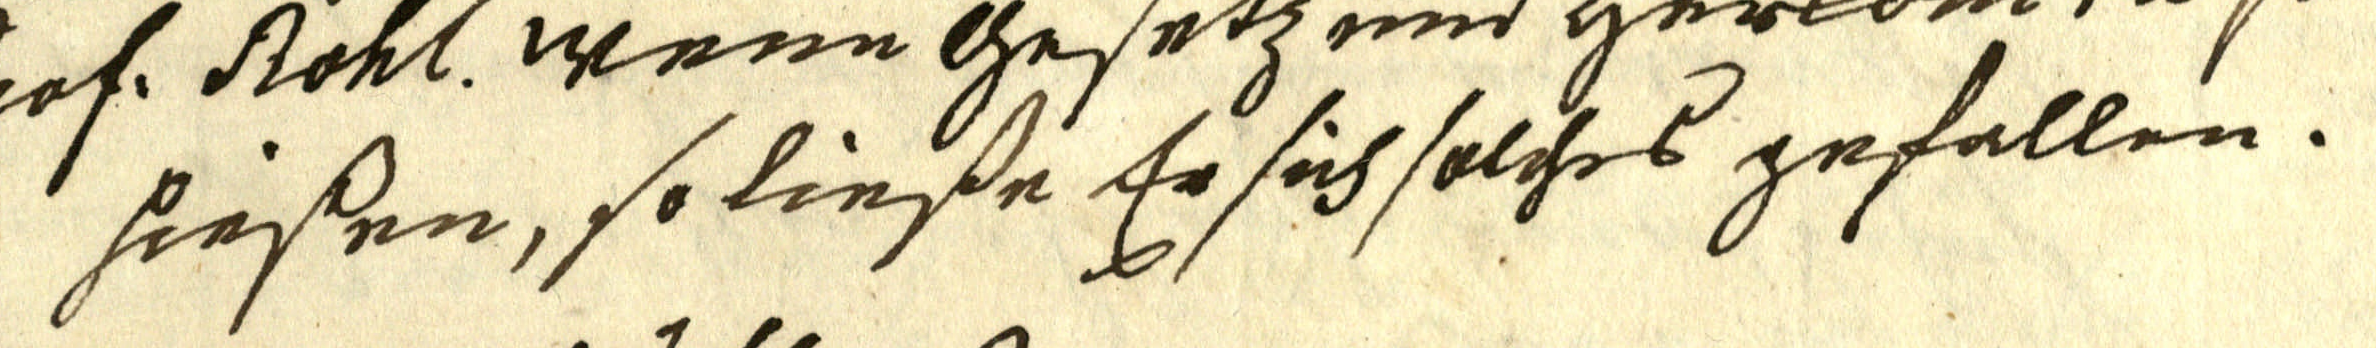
hießen, so ließe Er sich solches gefallen.
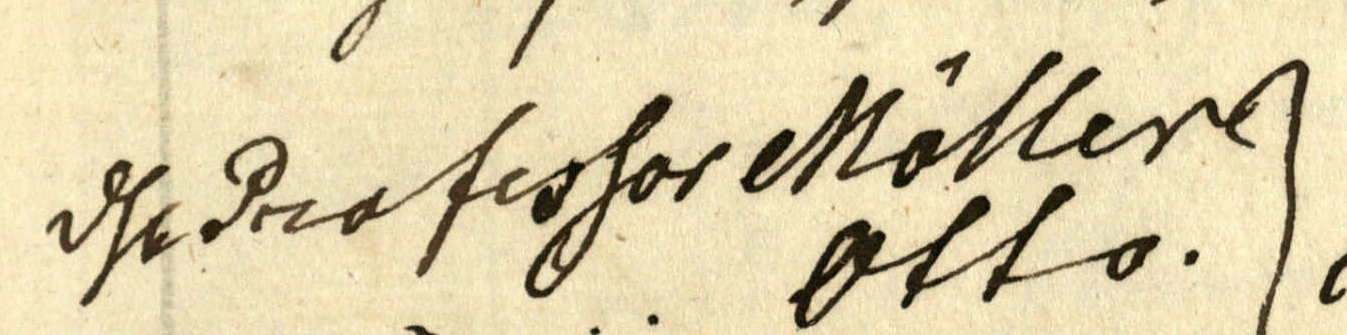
dh Professor Möller
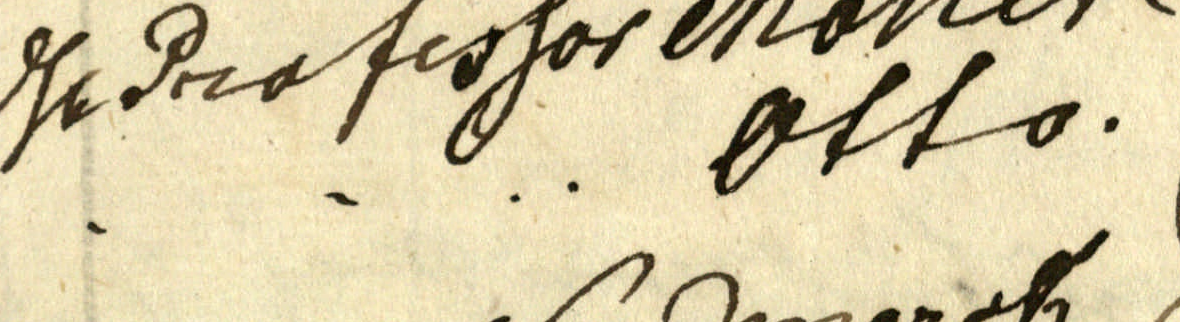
Otto
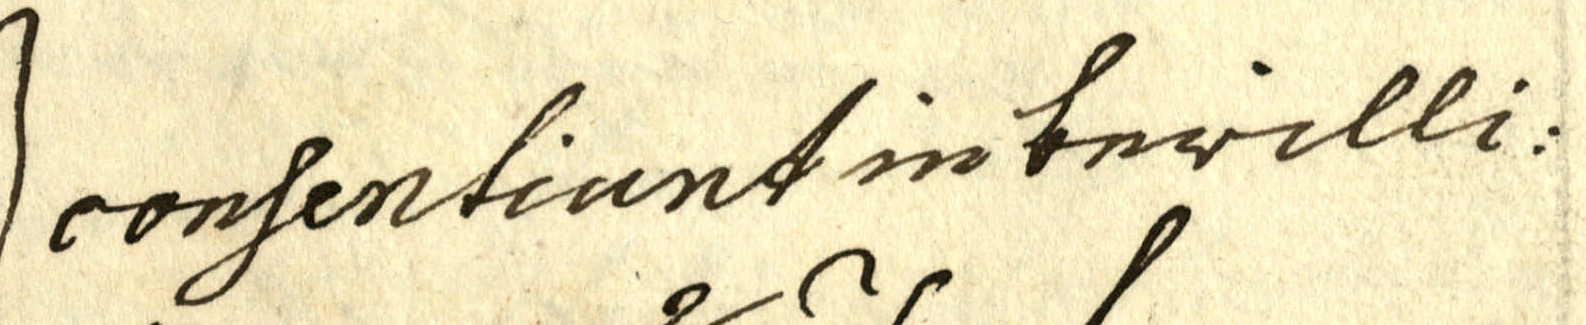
consentiunt in Bewilli¬
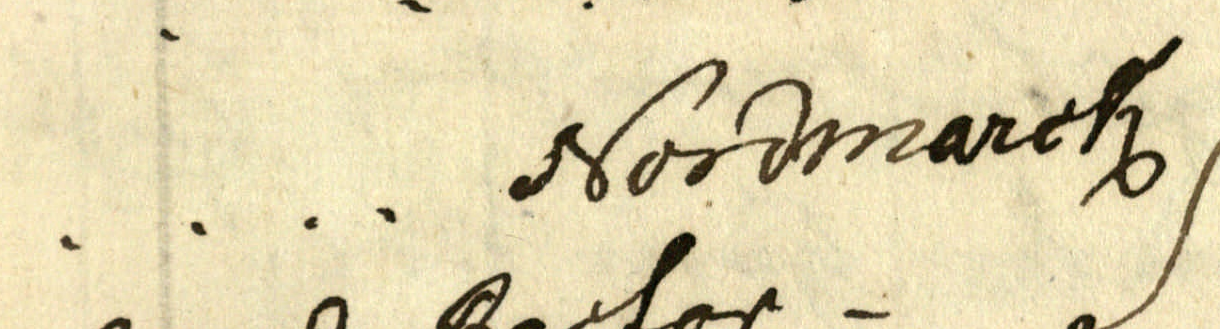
Nordmarck
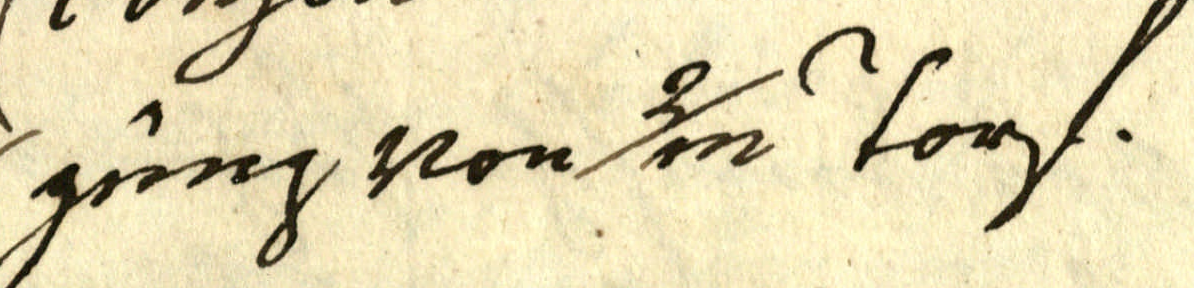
gung von 2/m Torf
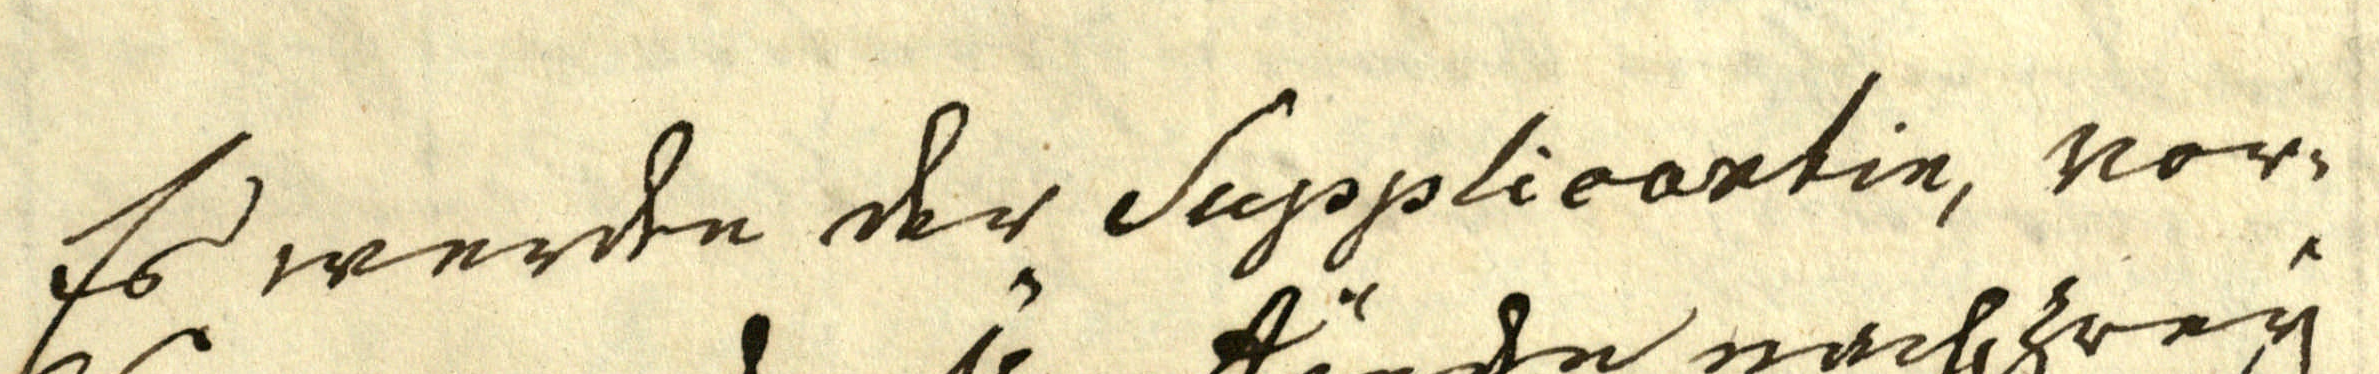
Es werden der Supplicantin, vor¬
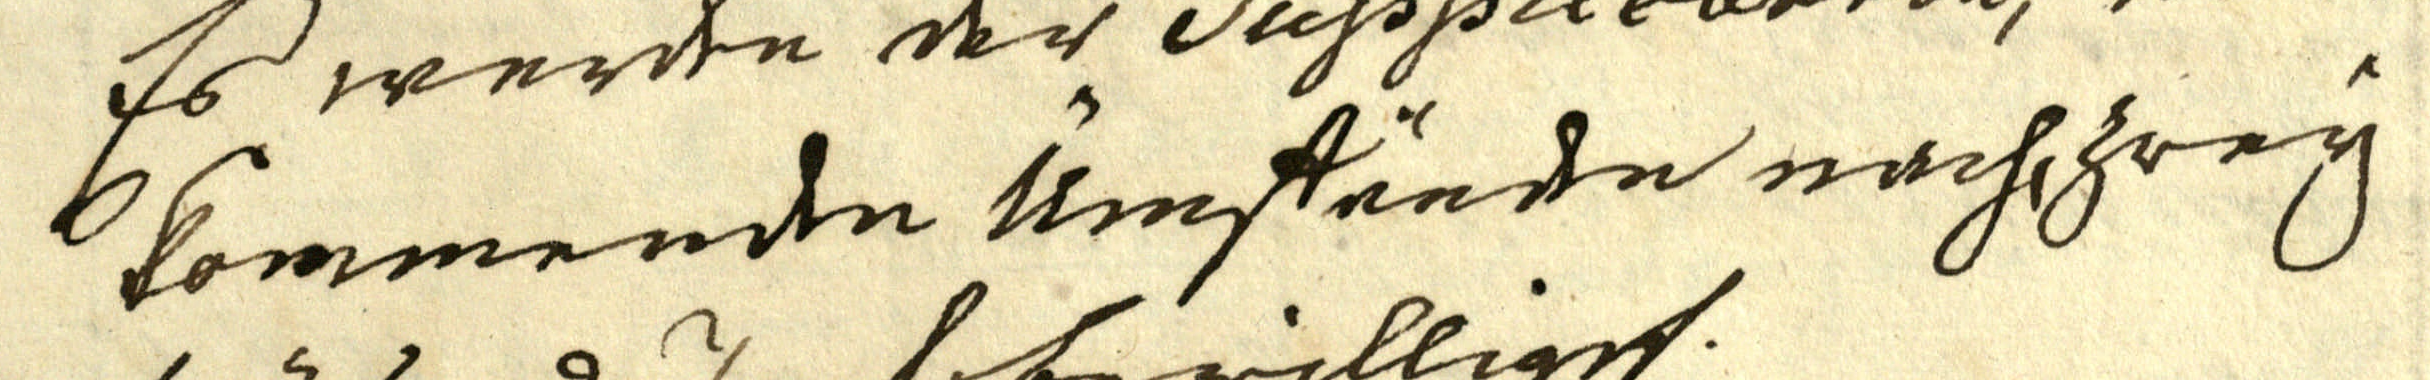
kommenden Umständen nach zweÿ
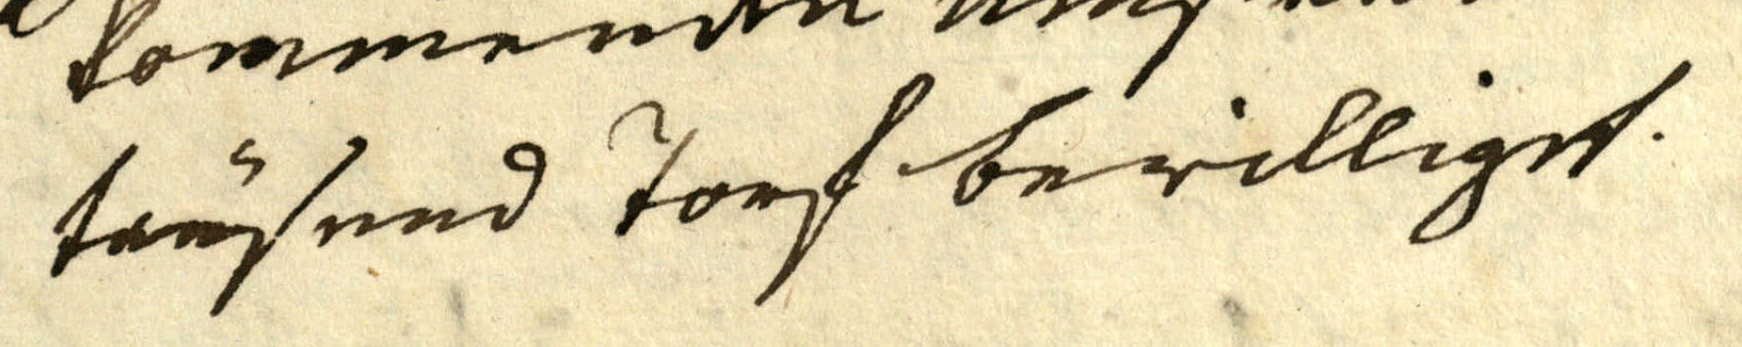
tausend Torf bewilliget.
